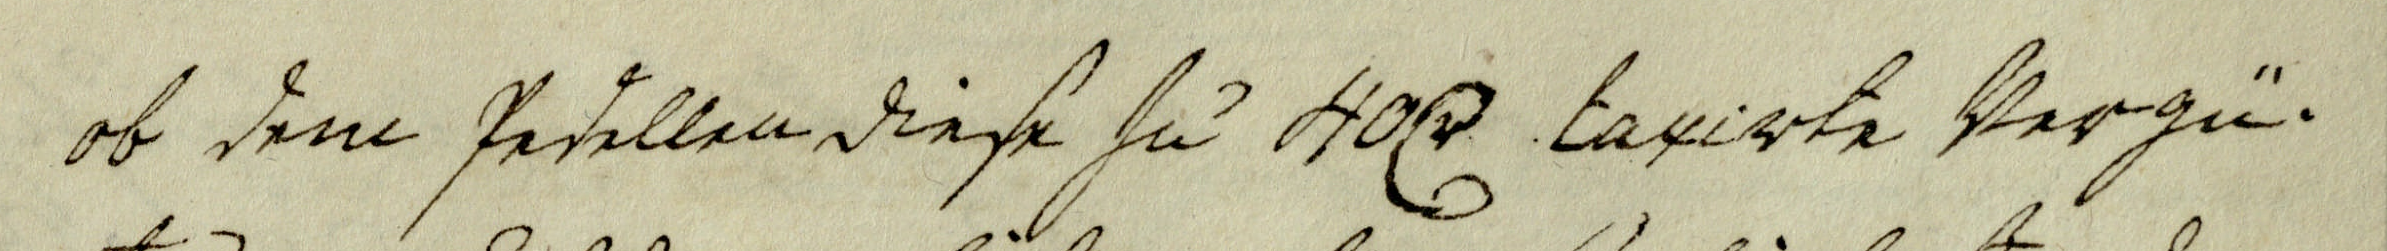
ob dem Pedellen diese zu 40 l. taxirte Vergü¬
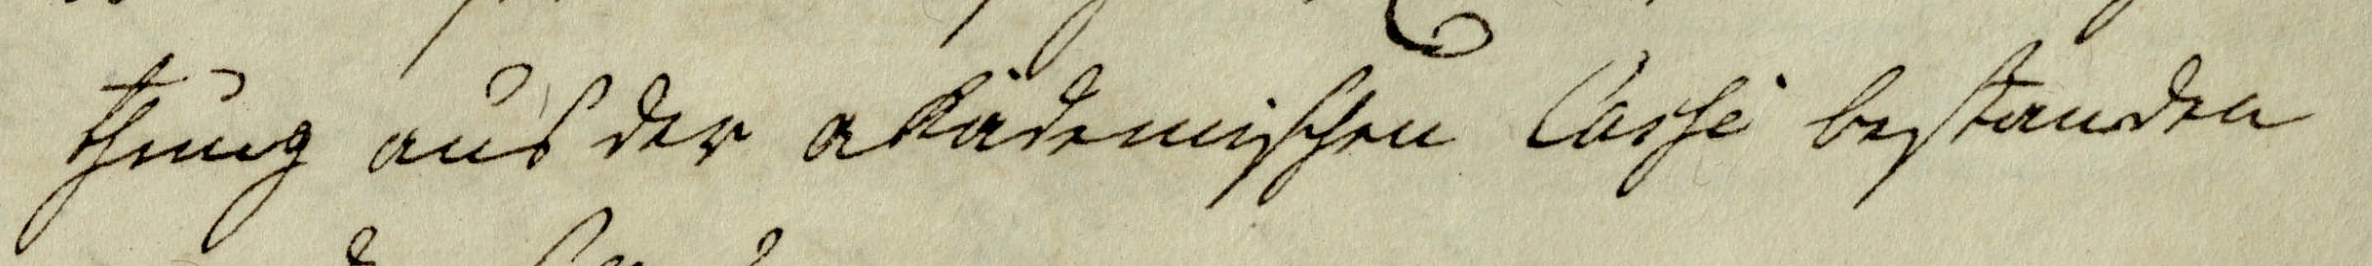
thung aus der akademischen Casse bestanden
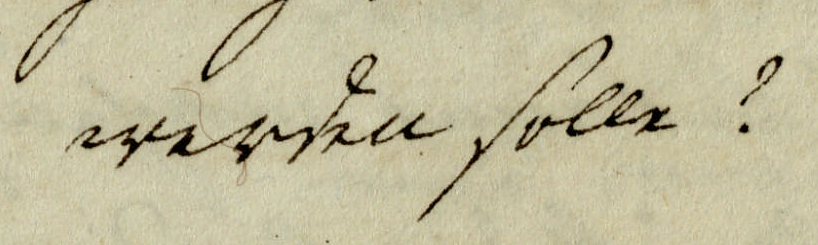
werden solle?
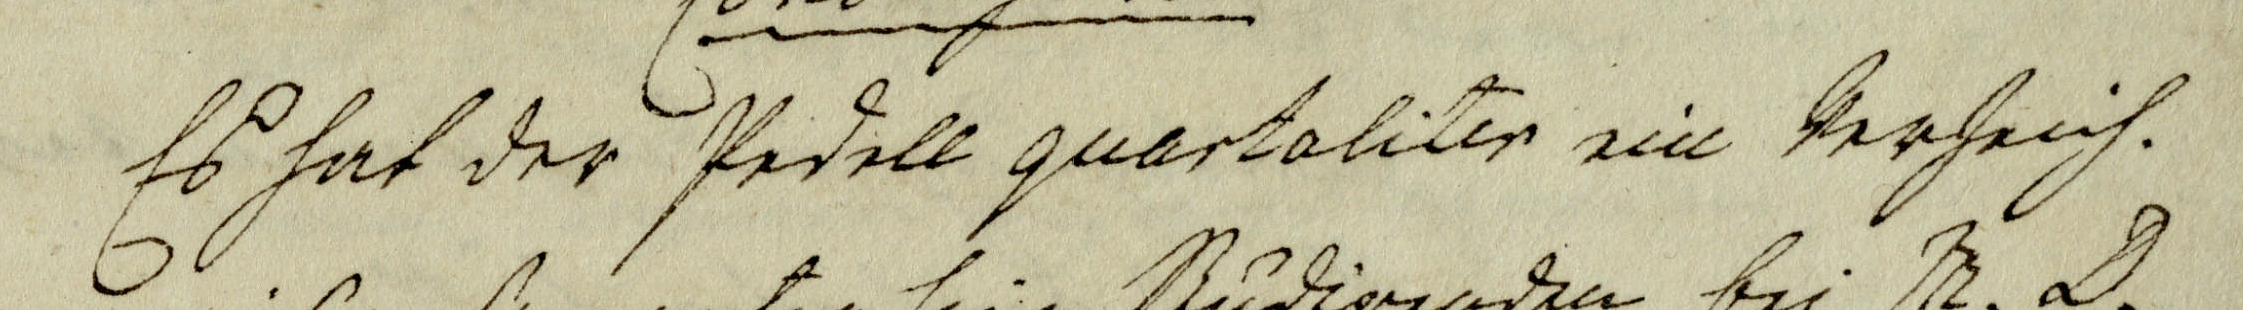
Es hat der Pedell quartaliter ein Verzeich¬
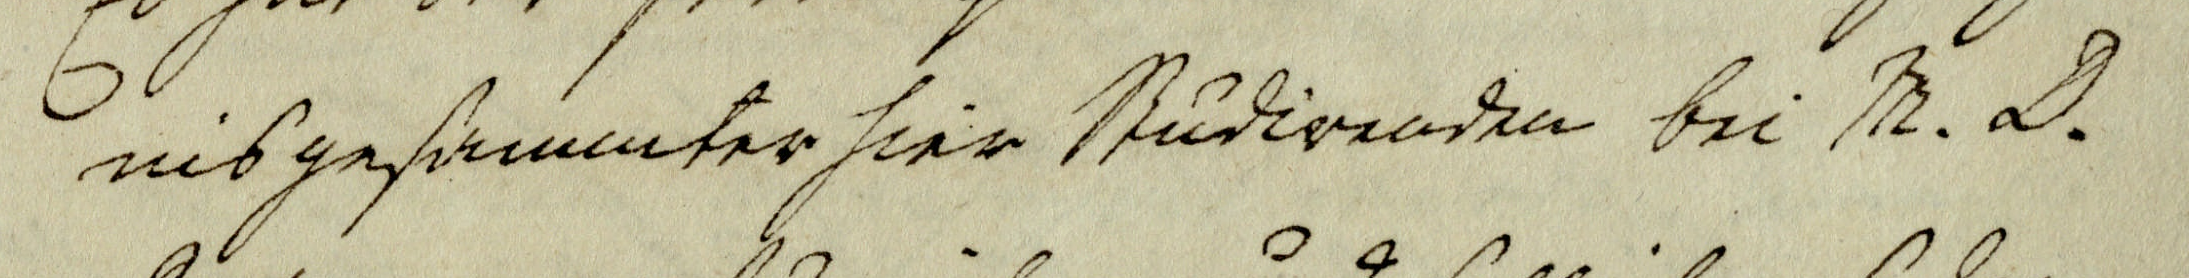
nis gesammter hier Studirenden bei M. D.
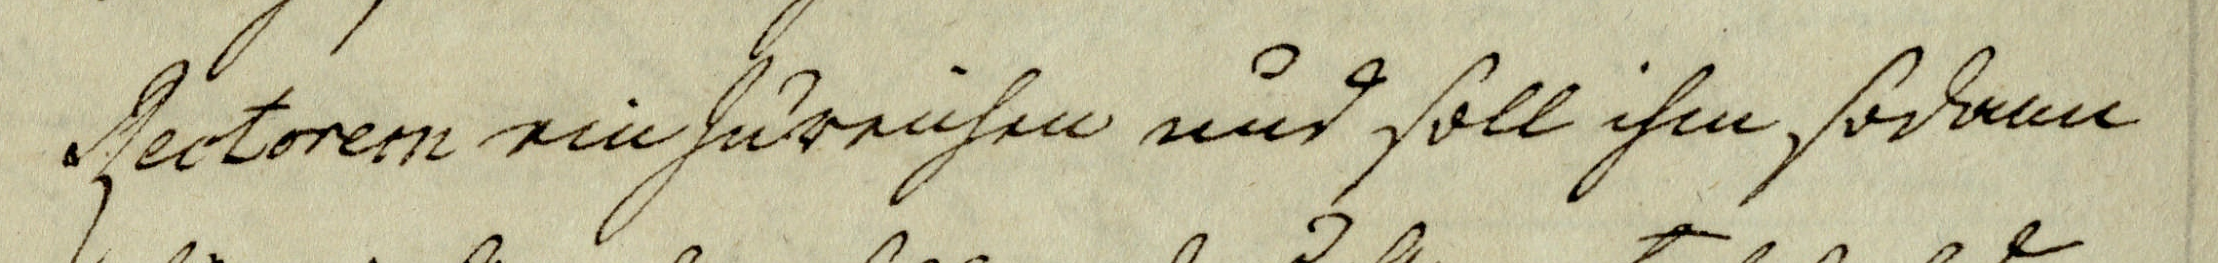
Rectorem einzureichen und soll ihm sodann
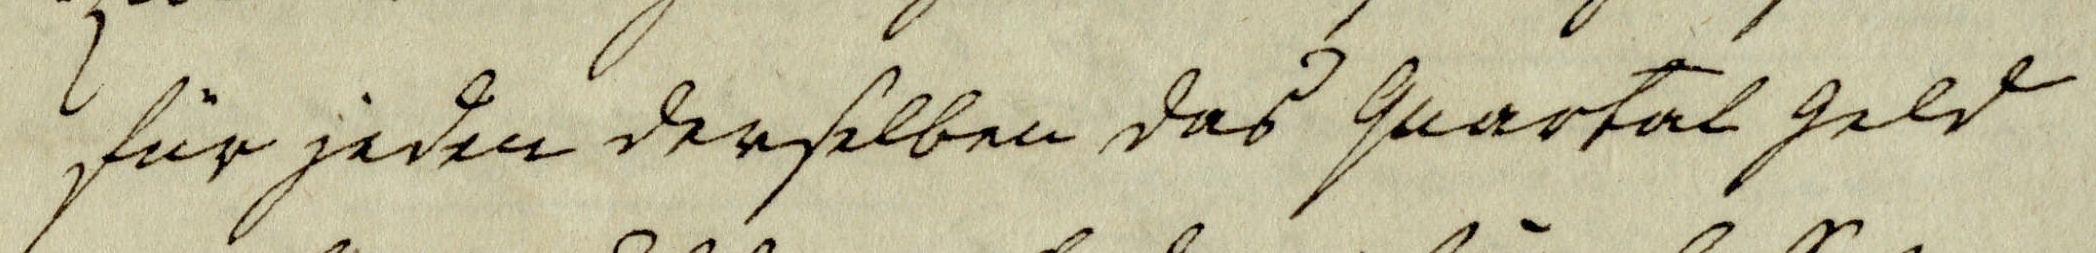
für jeden derselben das Quartal Geld
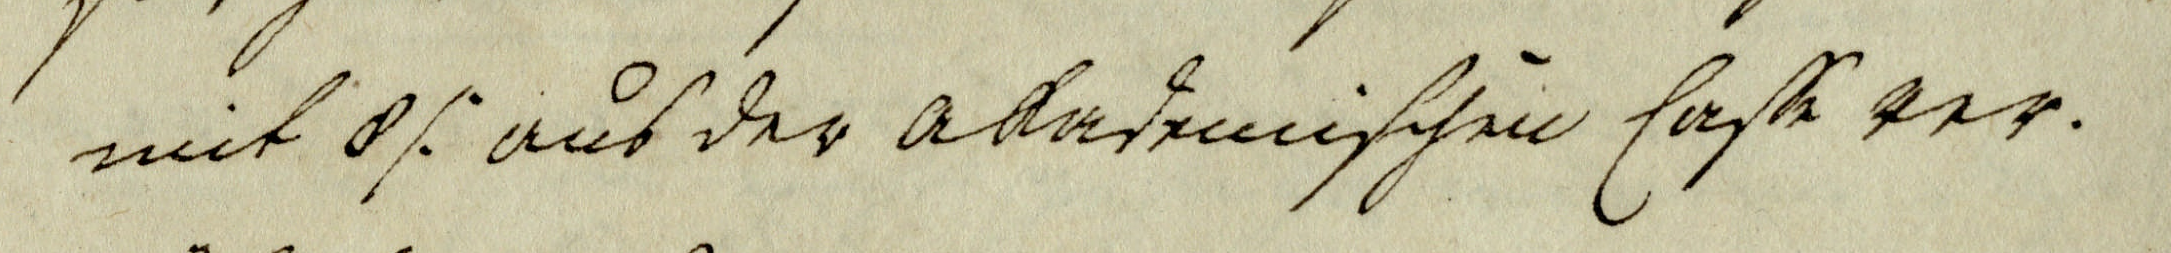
mit 8 s.aus der akademischen Casse ver¬
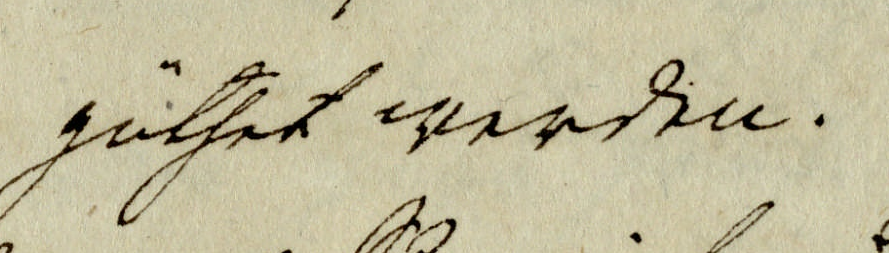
güthet werden.
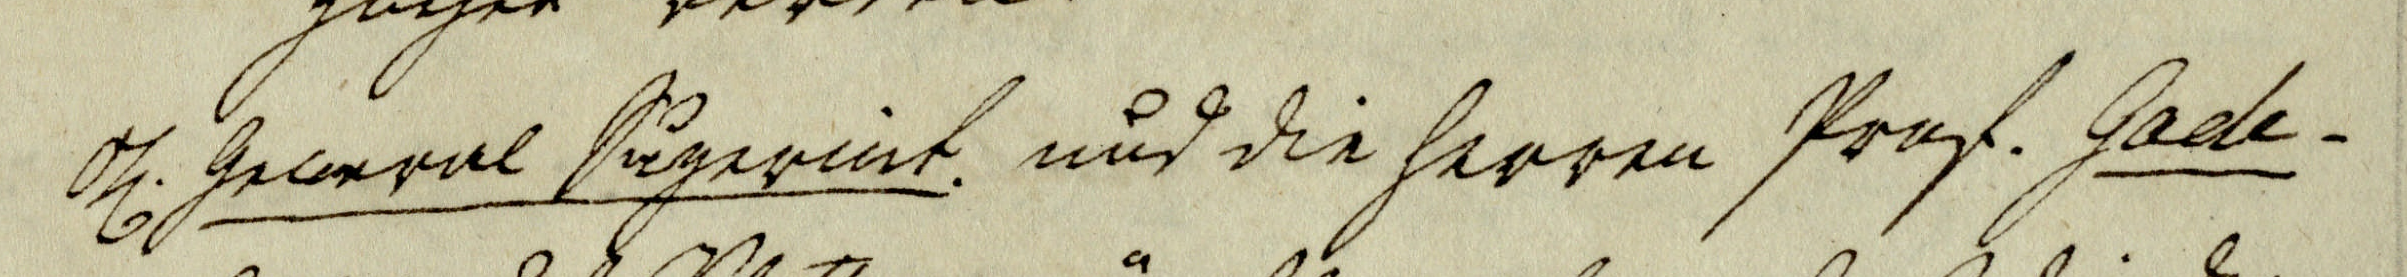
dh. General Superint. und die Herren Prof. Gade¬
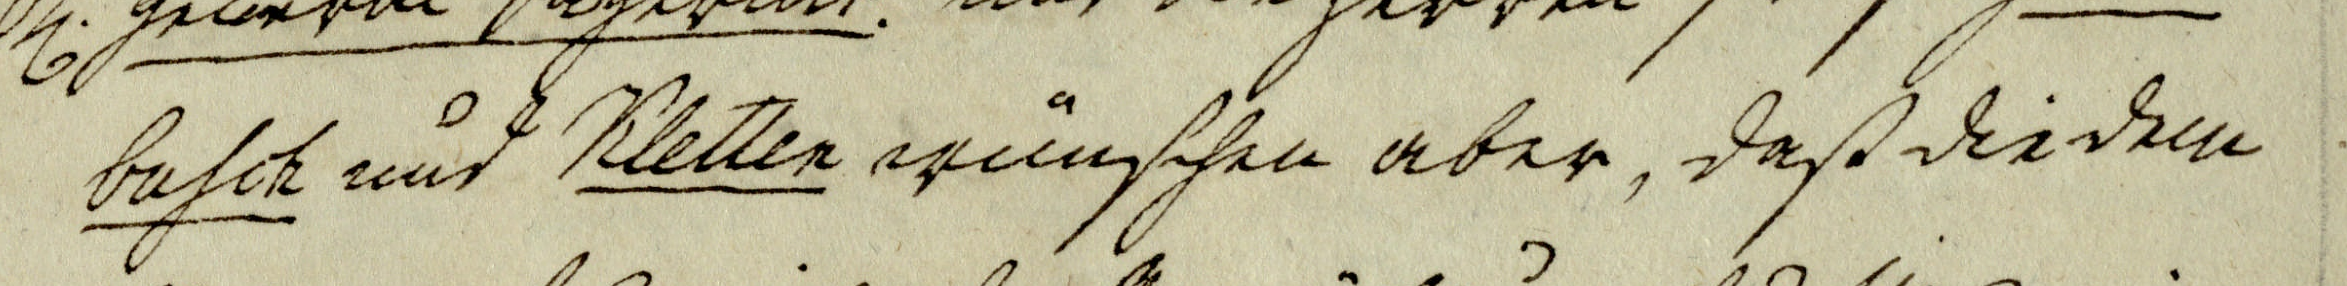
busch und Kletten wünschen aber, daß die dem
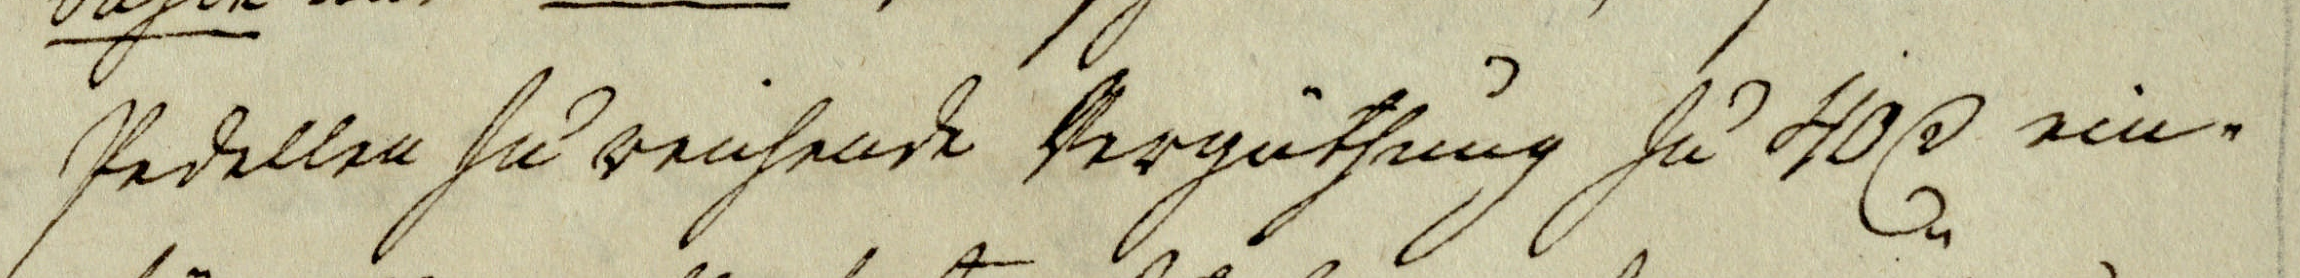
Pedellen zu reichende Vergüthung zu 40 l. ein
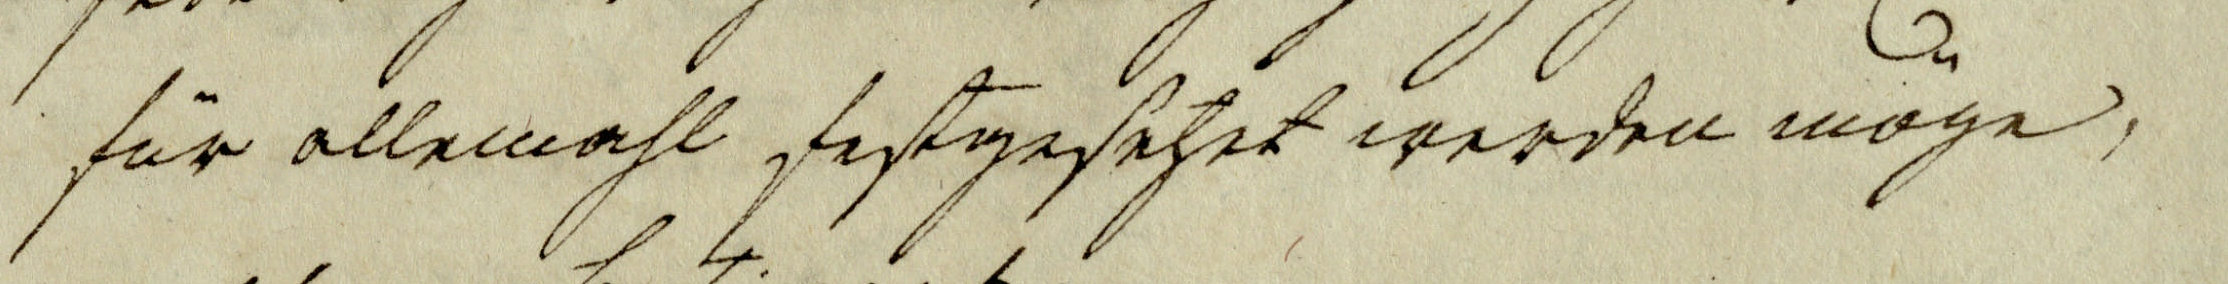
für allemahl festgesetzet werden möge,
